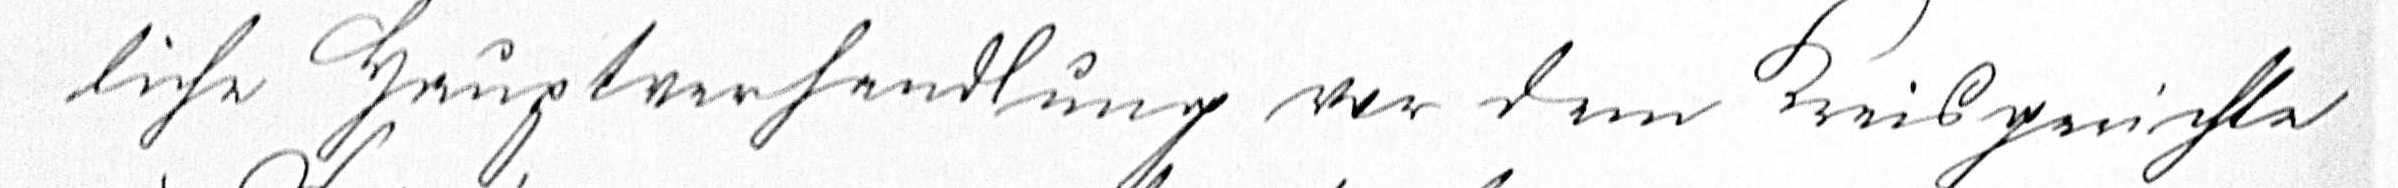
liche Hauptverhandlung von dem Kreisgerichte
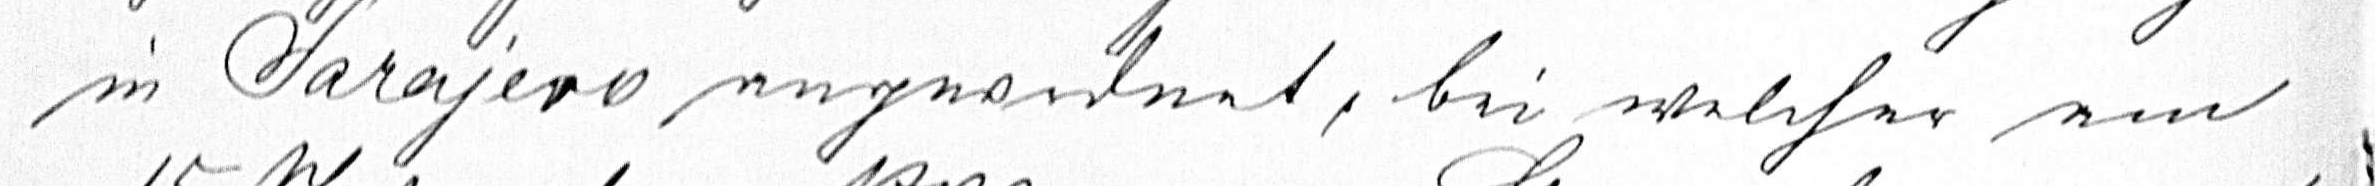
im Sarajevo angeordnet, bei welcher am
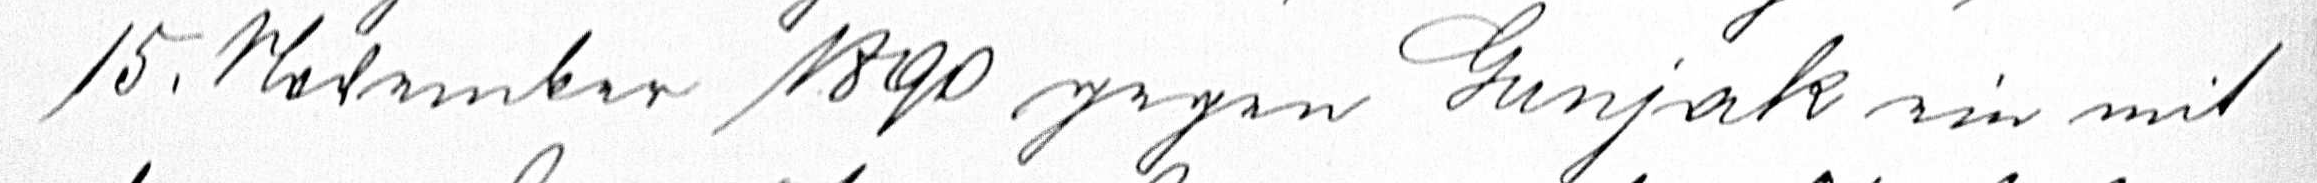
15. November 1890 gegen Gunjak ein mit
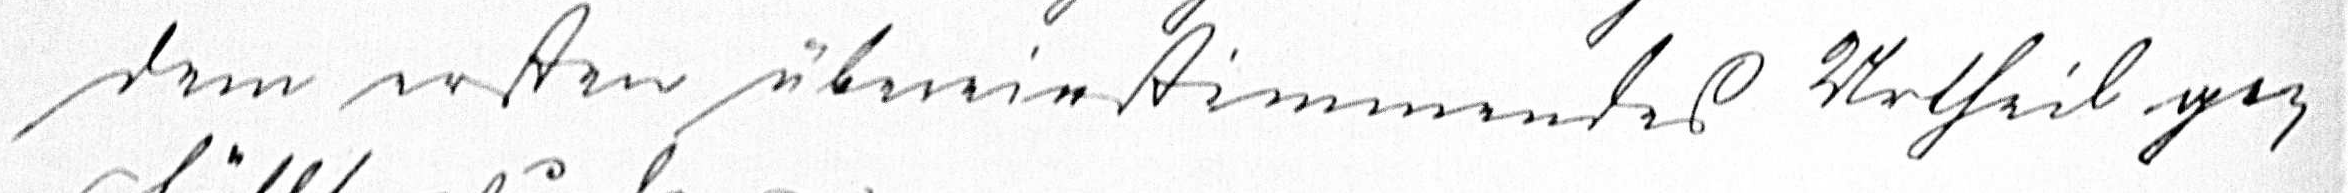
dem ersten übereinstimmendes Urtheil
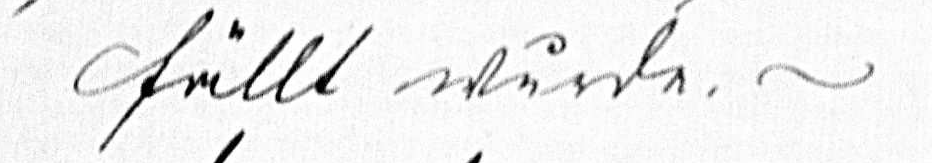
gefällt wurde.
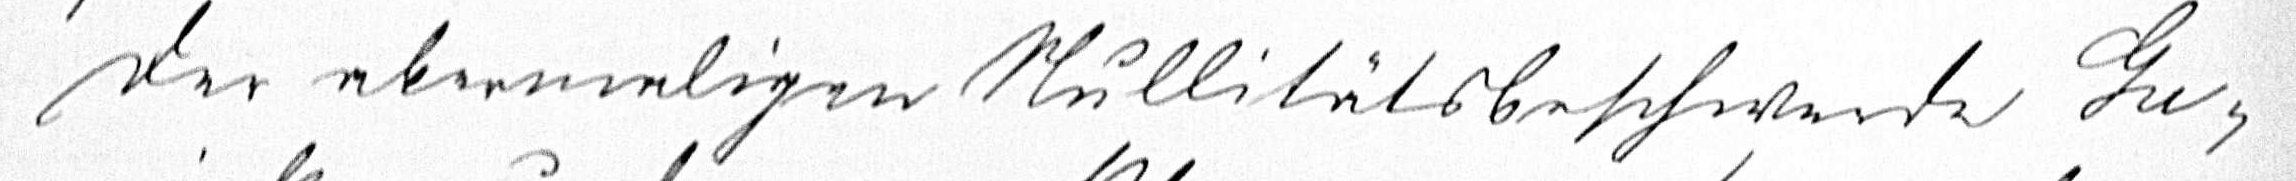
Der abermaligen Nullitätsbeschwerde Gu¬
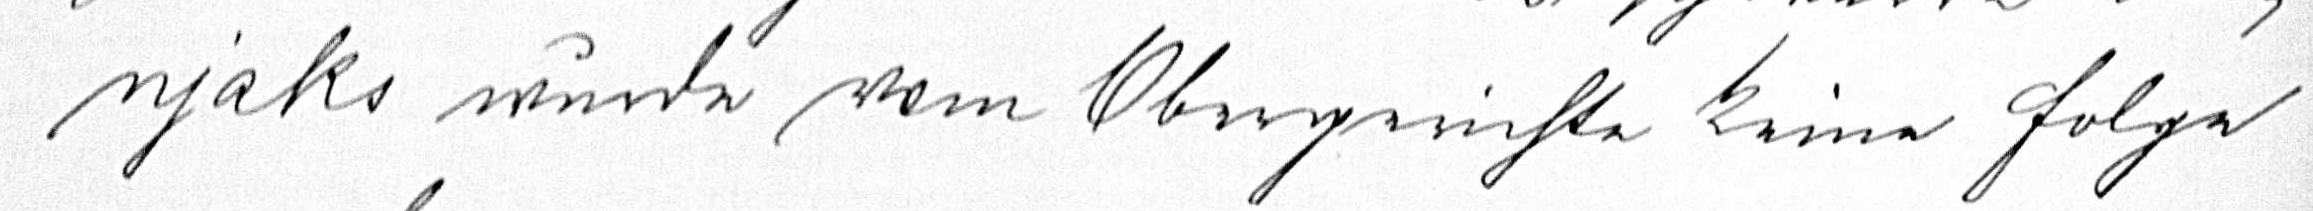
njaks wurde vom Obergerichte keine Folge
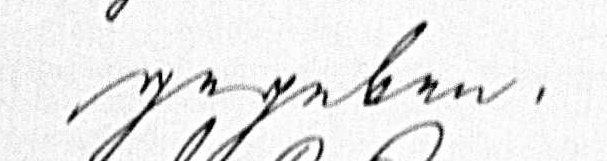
gegeben.
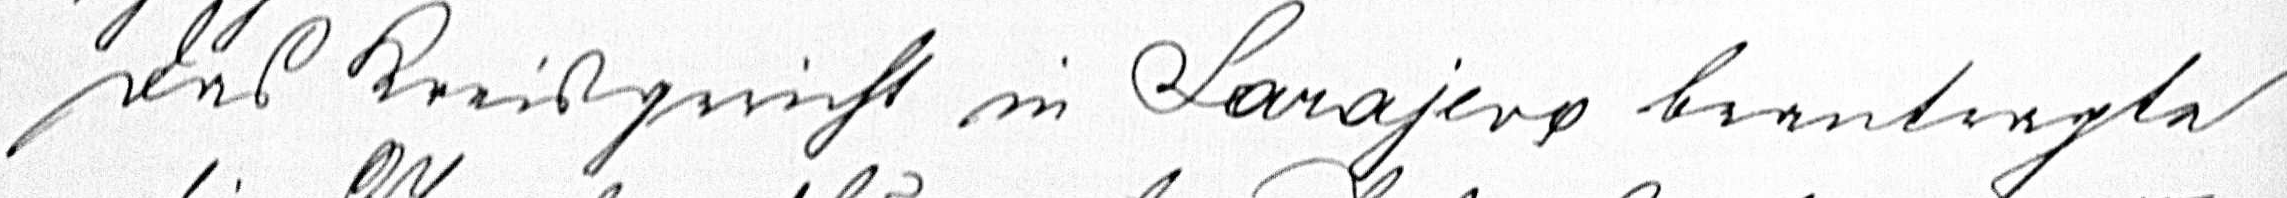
Das Kreisgericht in Sarajevo beantragte
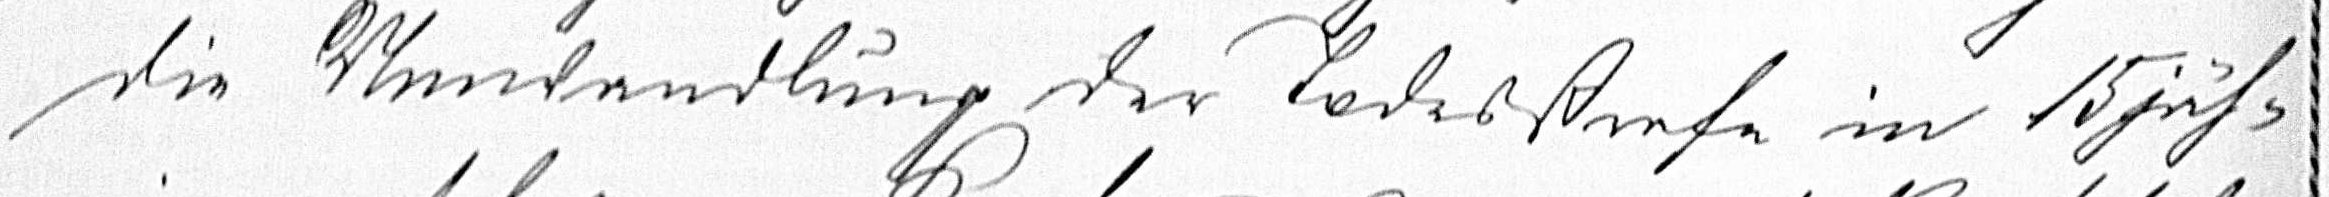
die Umwandlung der Todesstrafe in 15jäh¬
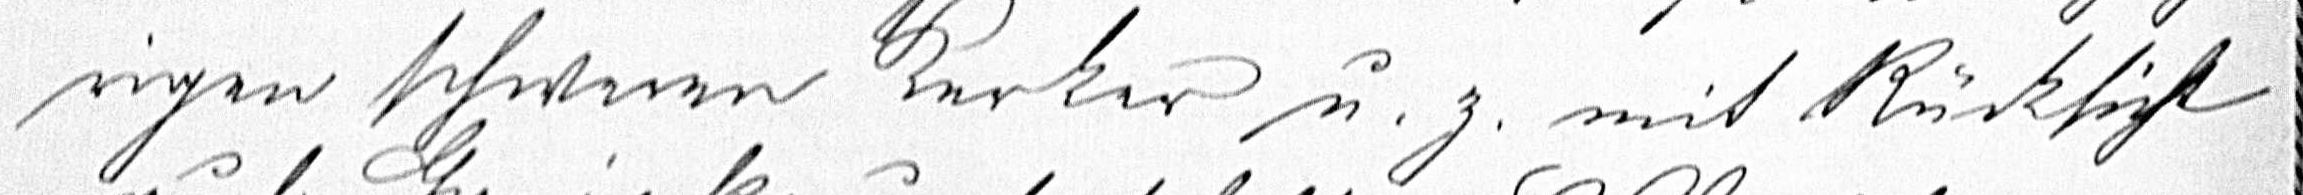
rigen schweren Kerker u.z. mit Rücksicht
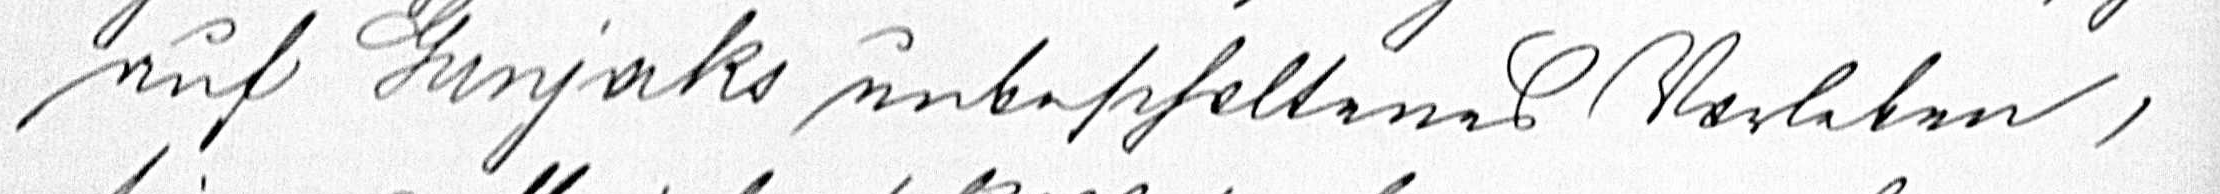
auf Gunjaks unbescholtenes Vorleben,
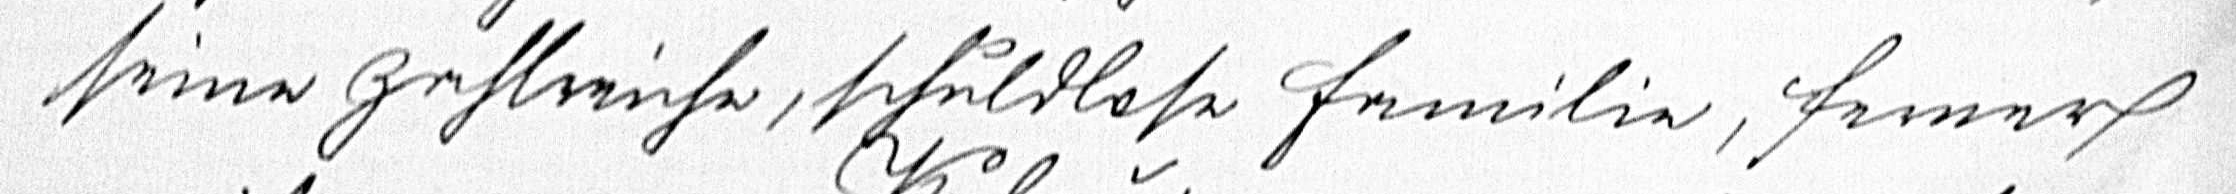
seine zahlreiche, schuldlose Familie, ferner
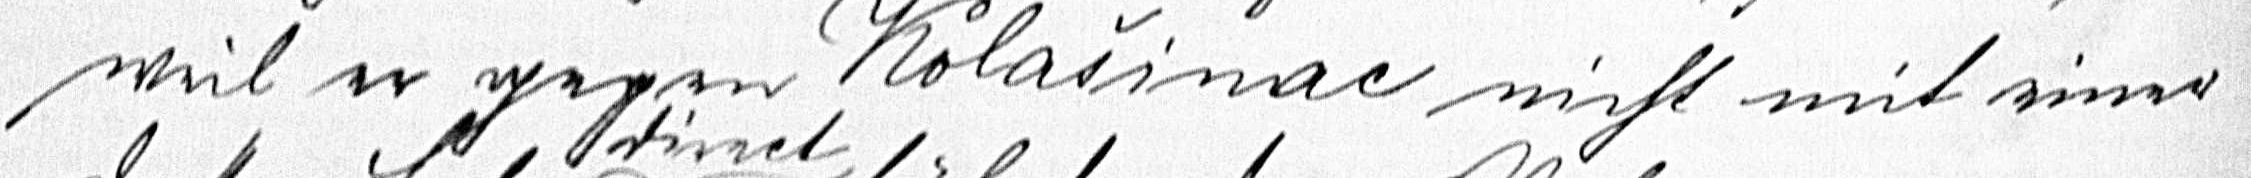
weil er gegen Kolašinac nicht mit einer
